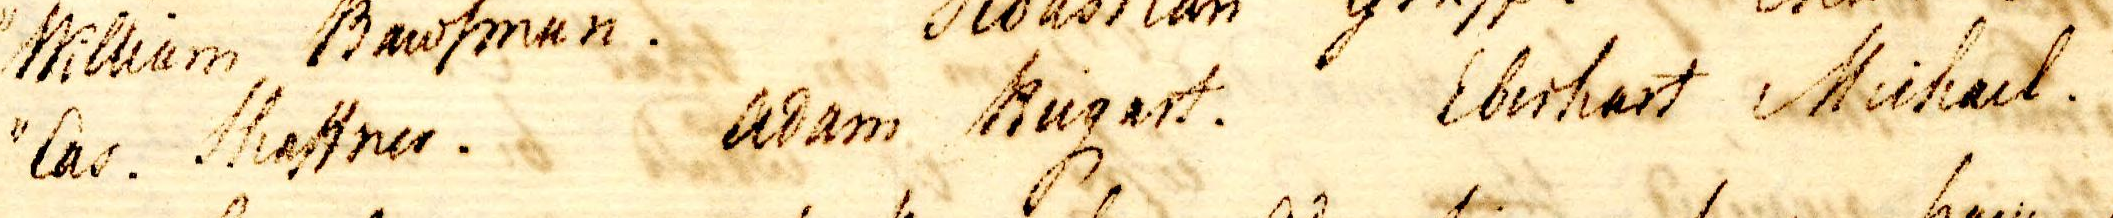"Cas. Shaffner. Adam Rugart. Eberhart Michael."
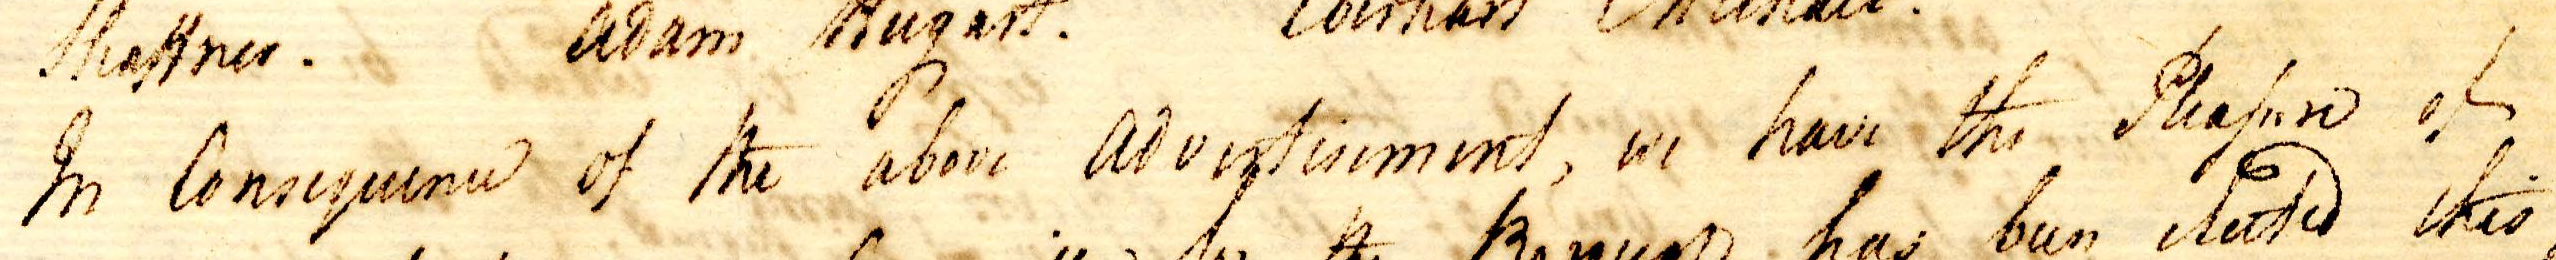In Consequence of the above Advertisment, we have the Pleasure of
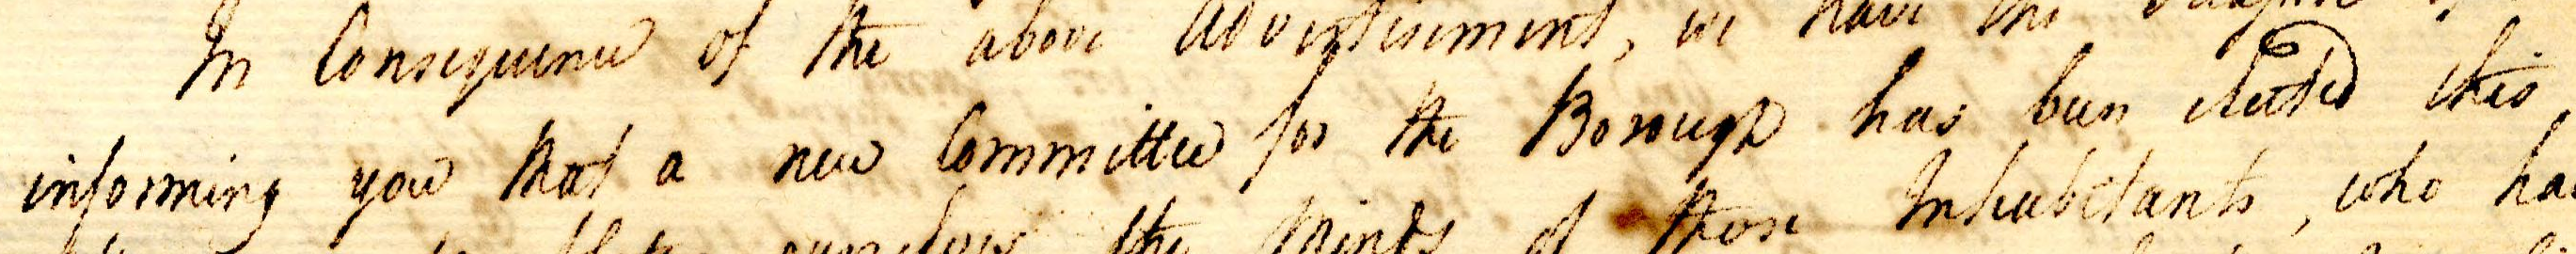informing you that a new Committee for the Borough has ben elected this
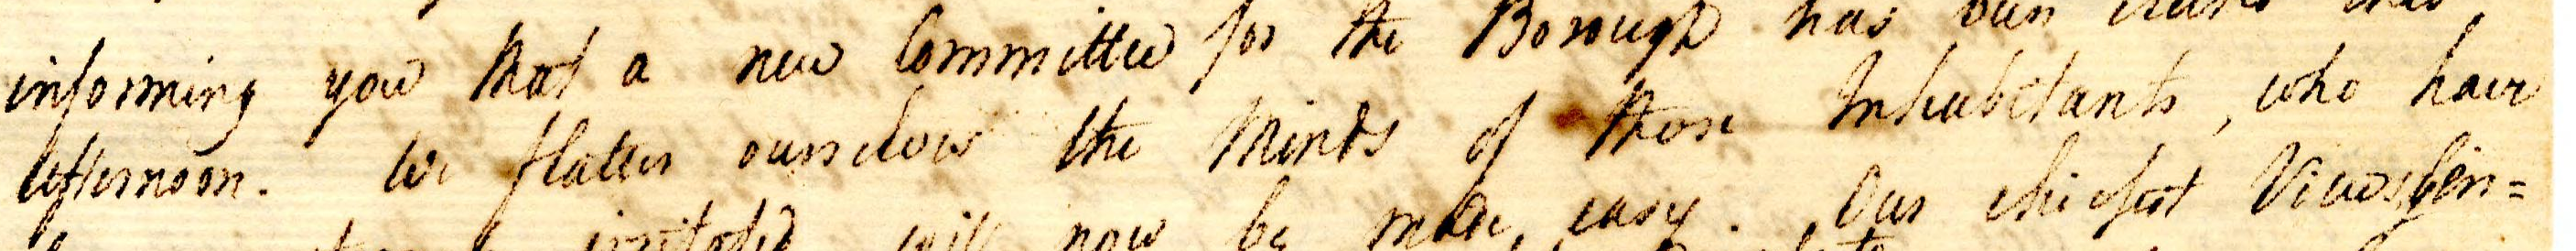afternoon. We flatter ourselves the Minds of those Inhabitants, who have
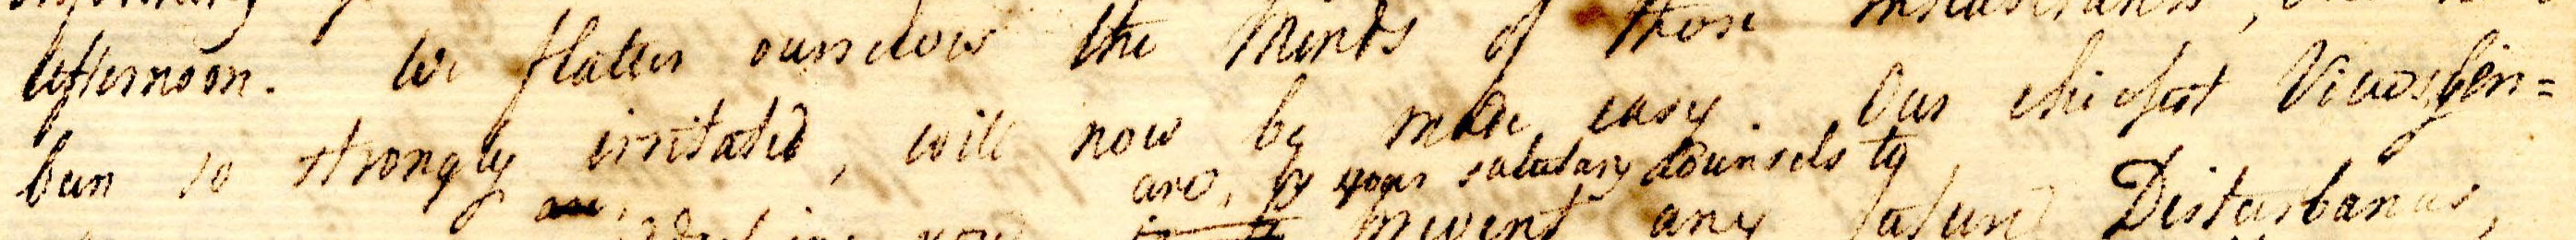been so strongly irritated, will now be made easy. Our chiefest Views Gen-
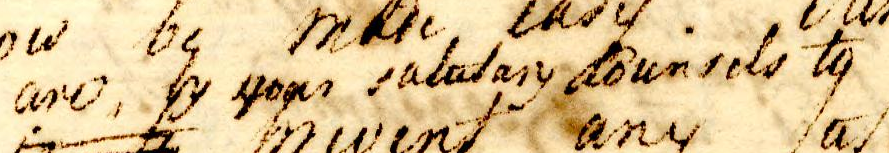are by your salutary Laurels to
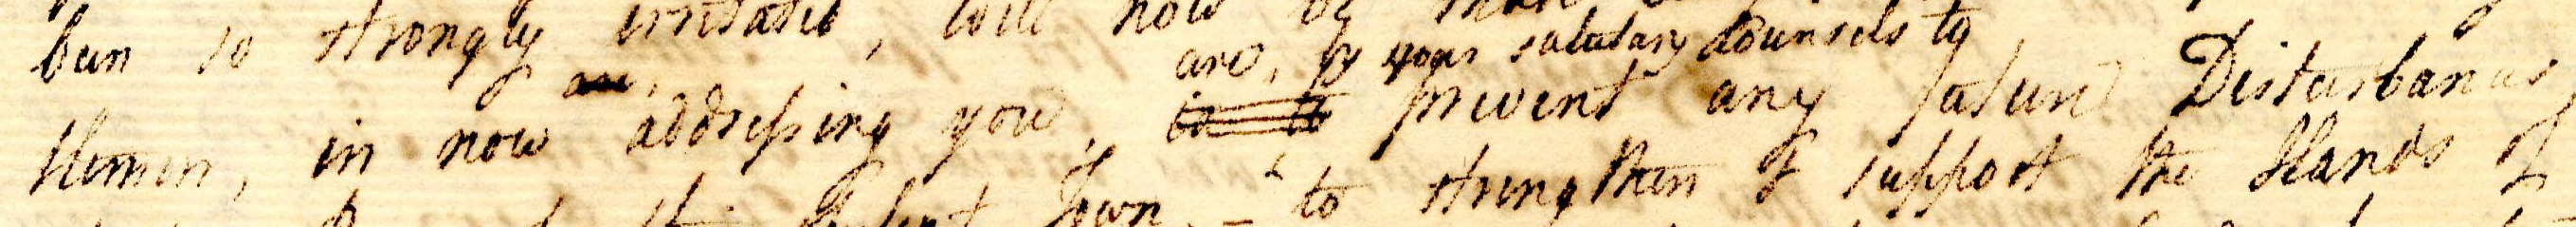-tlemen, in now addressing you. [as to] prevent any future Disturbance
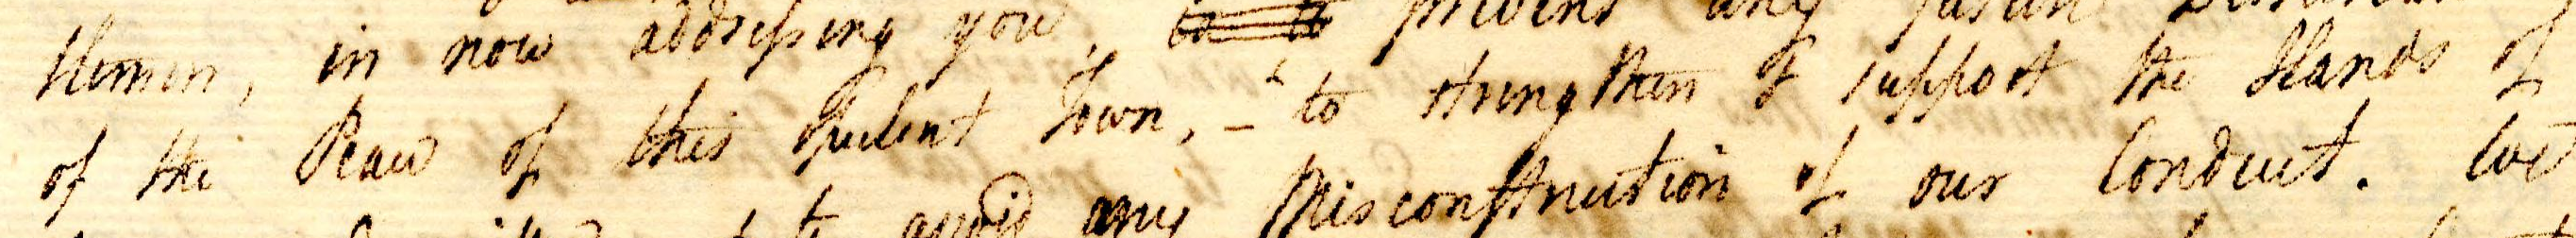of the Peace of this opulent town, to strengthen & support the Hands of
